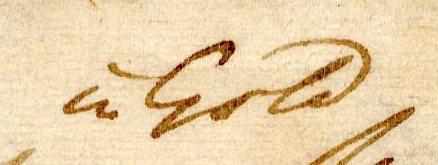a Gold
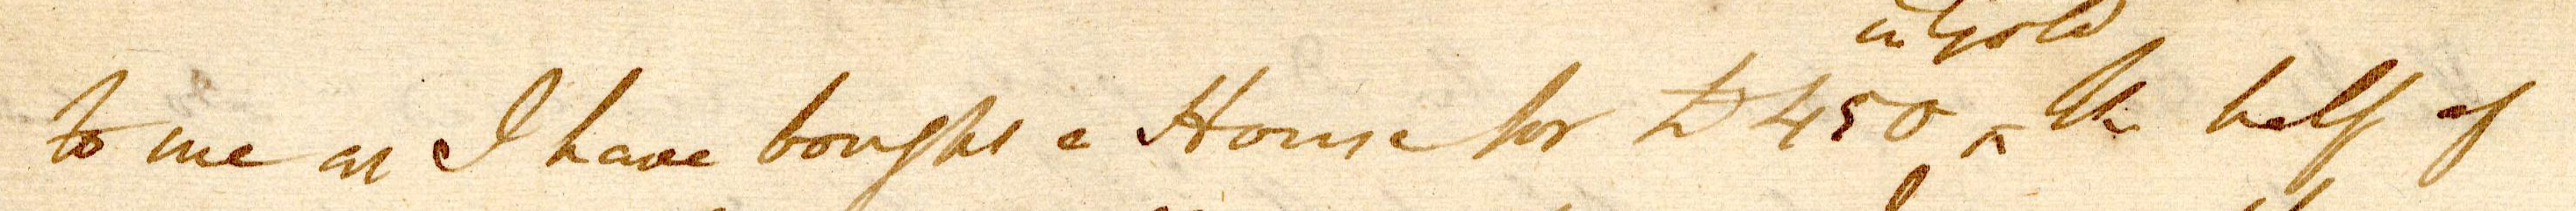to me as I have bought a House for £450 ^ the half of
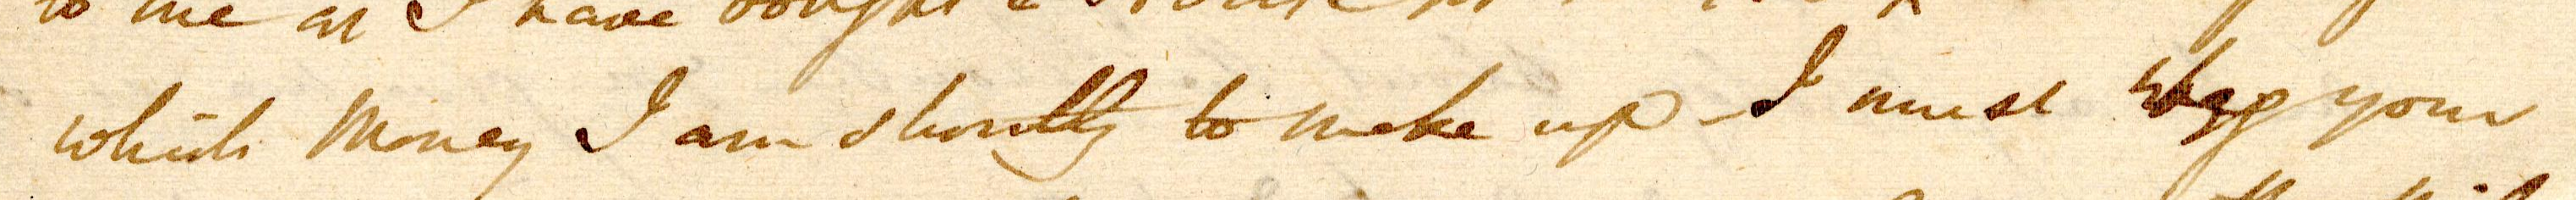which Money I am shortly to make up. I must beg your
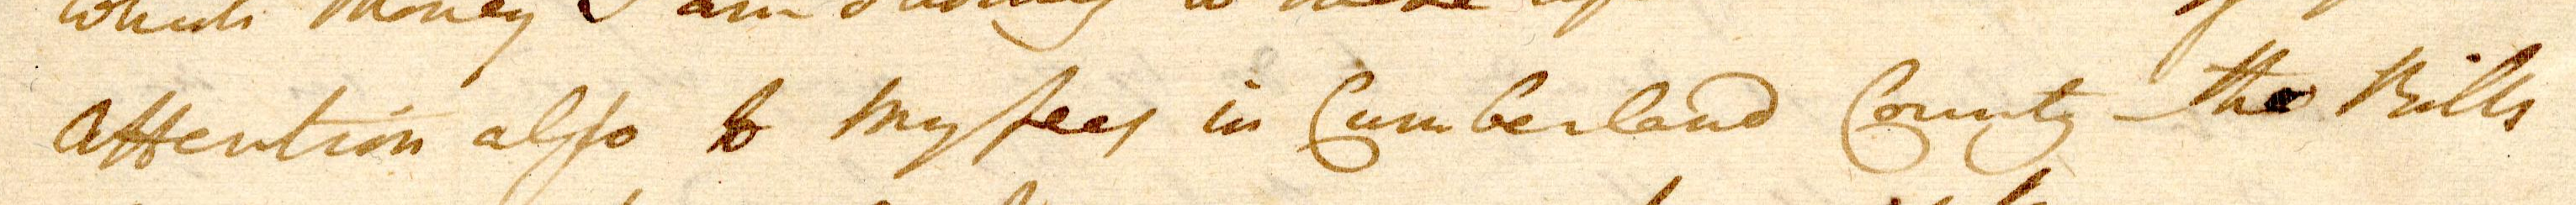Attention also to my fees is Cumberland County. the Bills
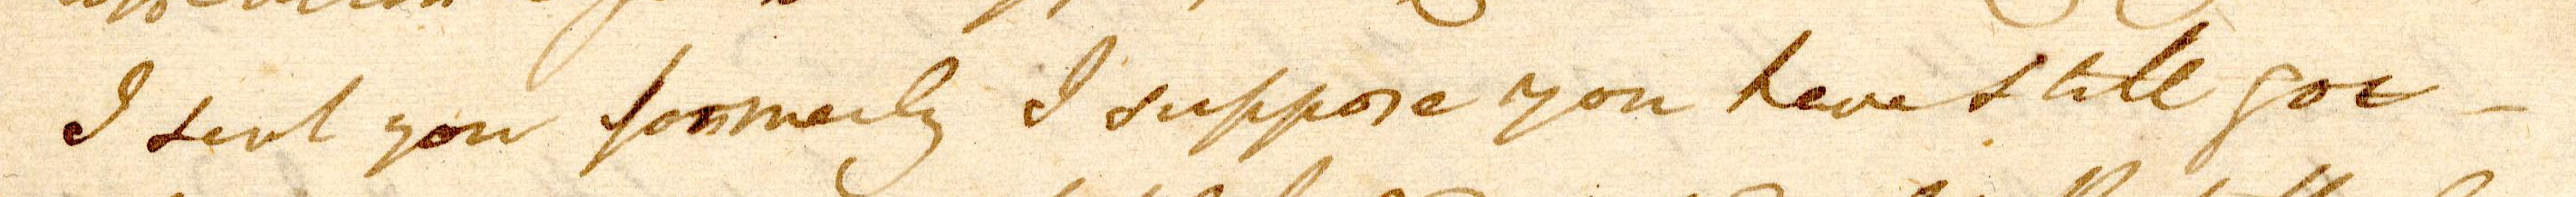I sent you formerly I suppose you have still got.
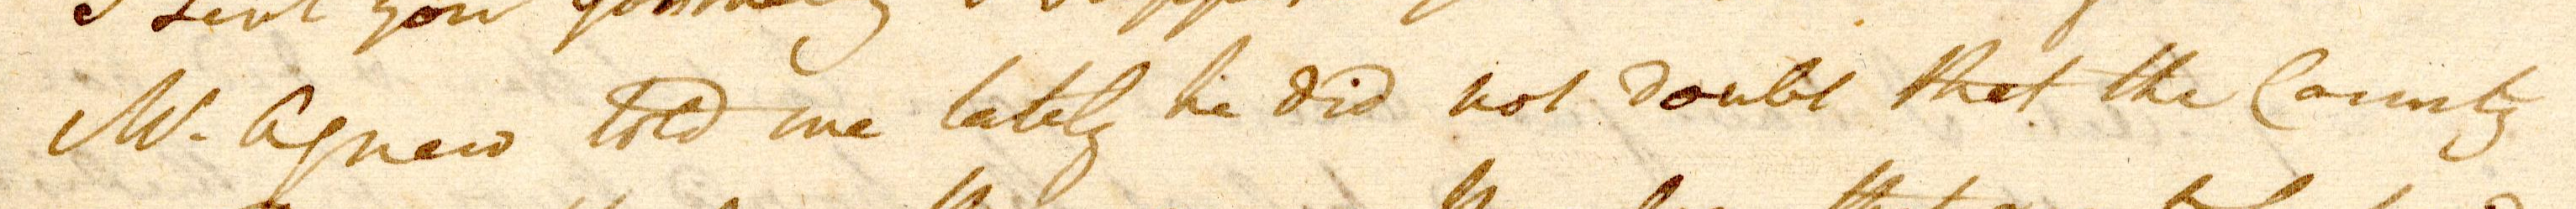M^r. Agnew told me lately he did not doubt that the County
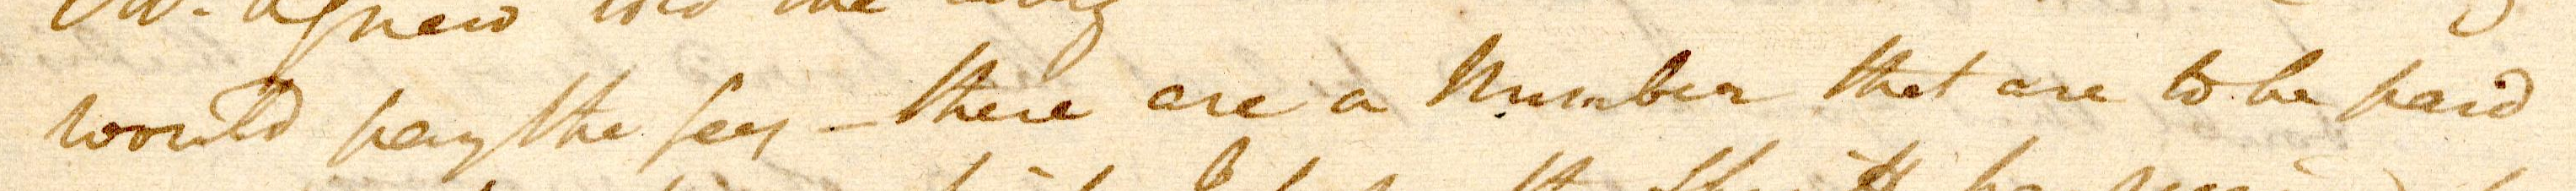would pay the fees. there are a Number that are to be paid
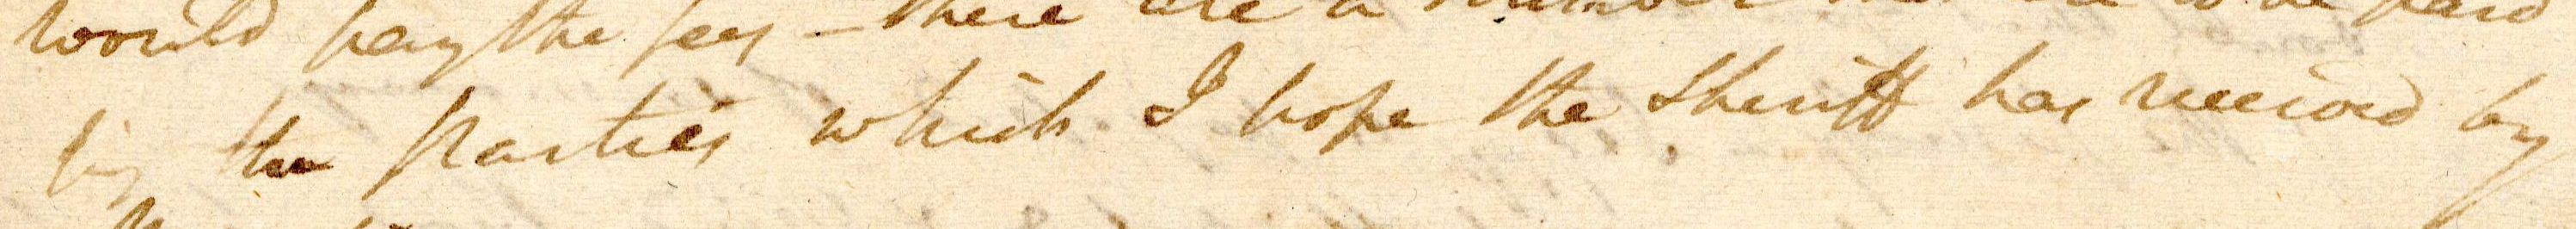by the parties which I hope the sheriff has received by
